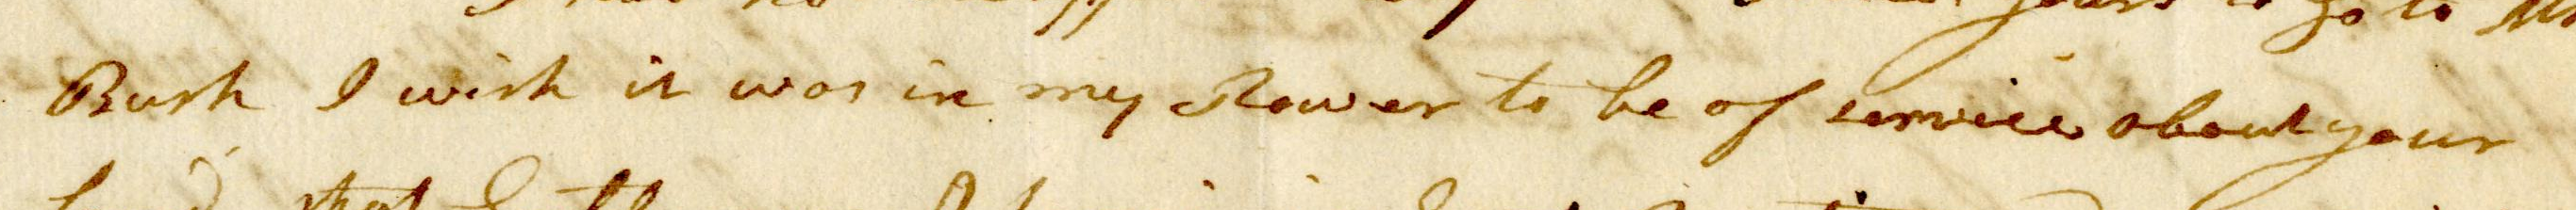Bush I wish it was in my Power to be of service about your
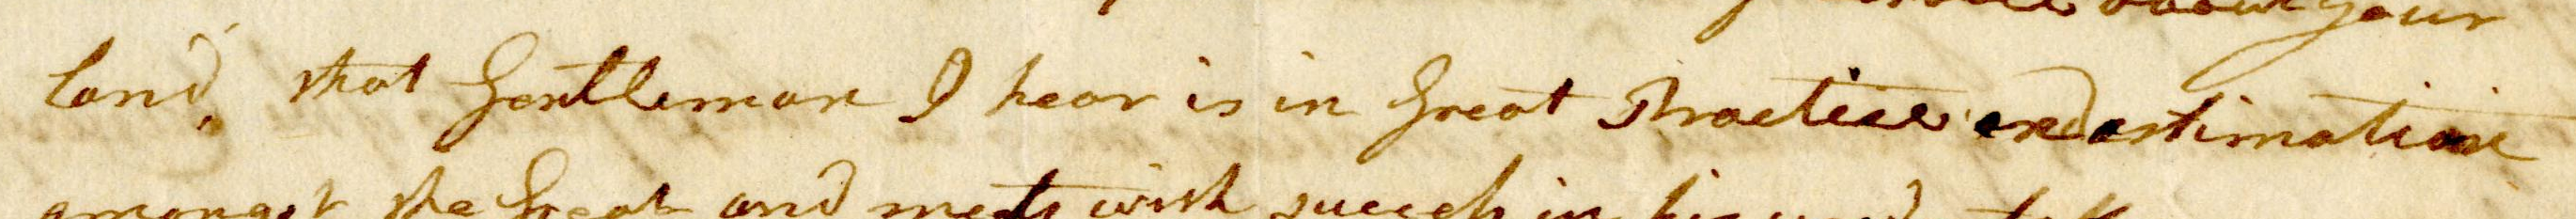land, that Gentleman I hear is in Great practice and estimates
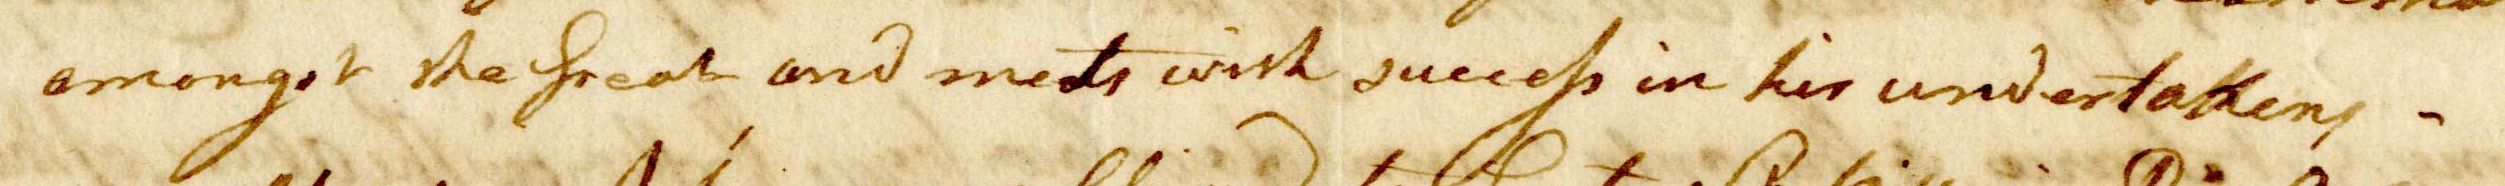amongst the Great and meets with success in his undertaking.
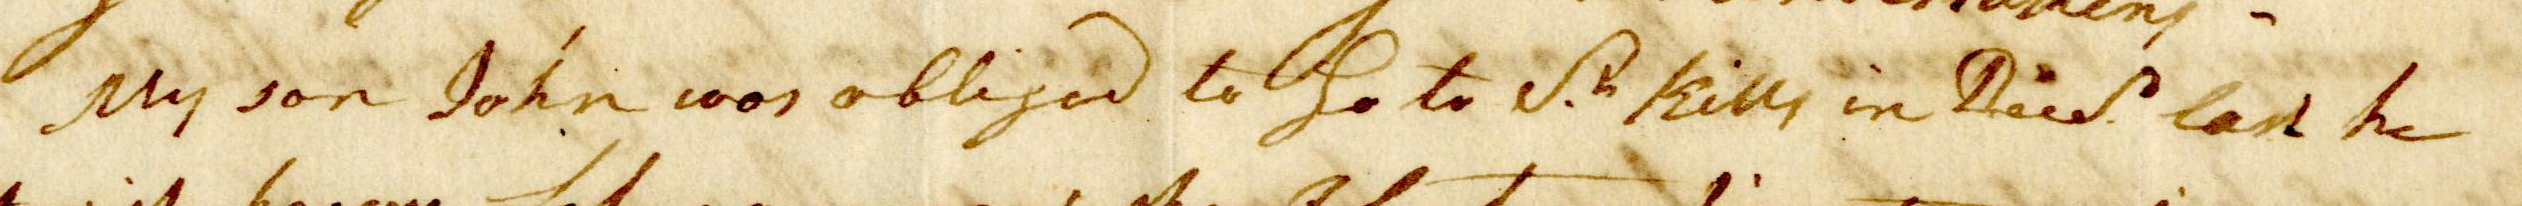My son John was obliged to Go to S^h. Killy in Dece^r. last he
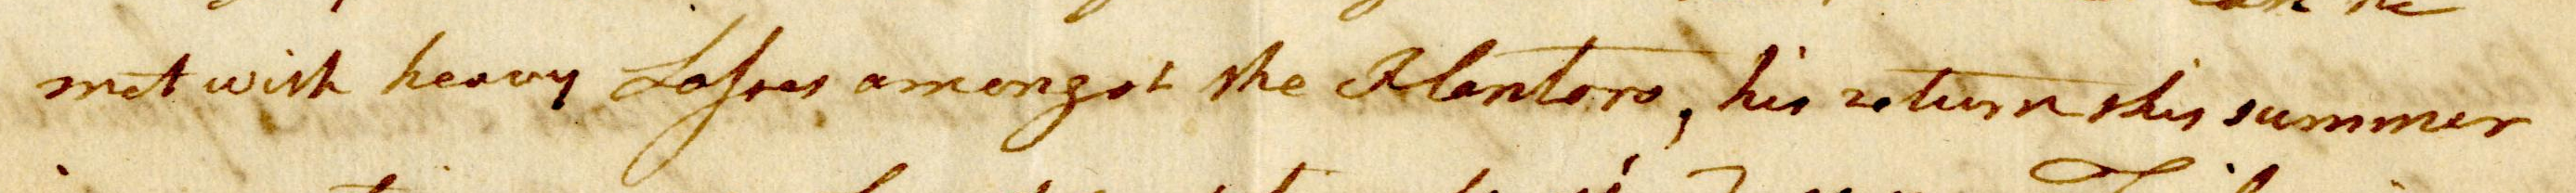met with heavy Losses amongst the Planters, his return this summer
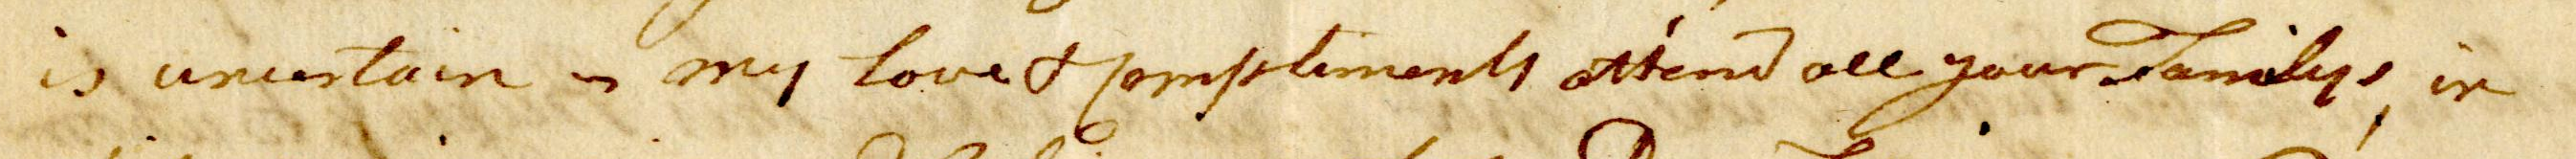is uncertain- my love & Compliments attend all your Familys, in
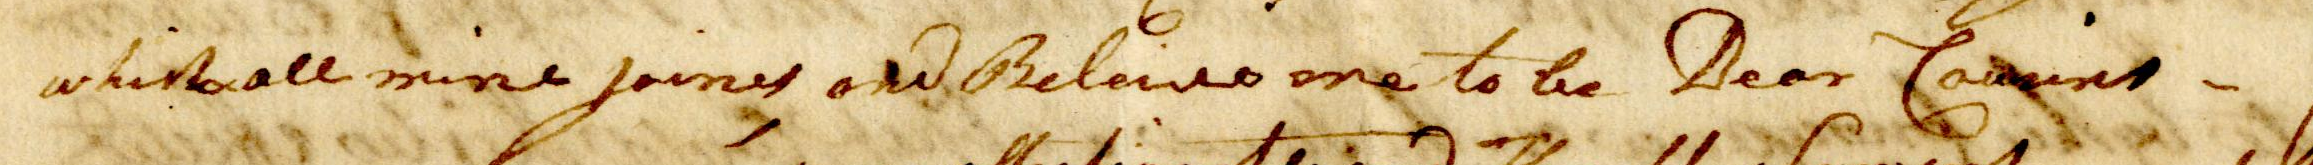which all mine joins and Believe me are to be Dear cousin.-
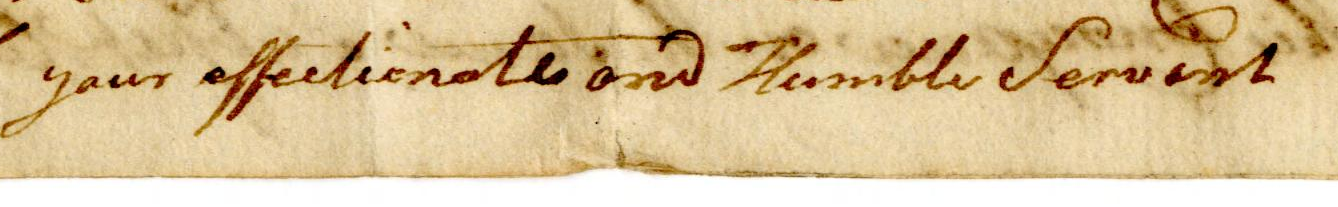your affectionate and Humble Servant
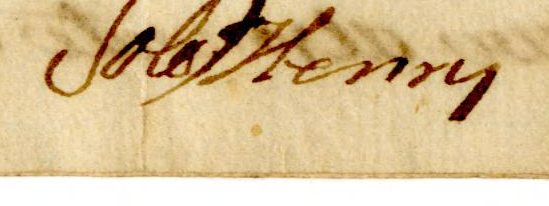Solo Henry
